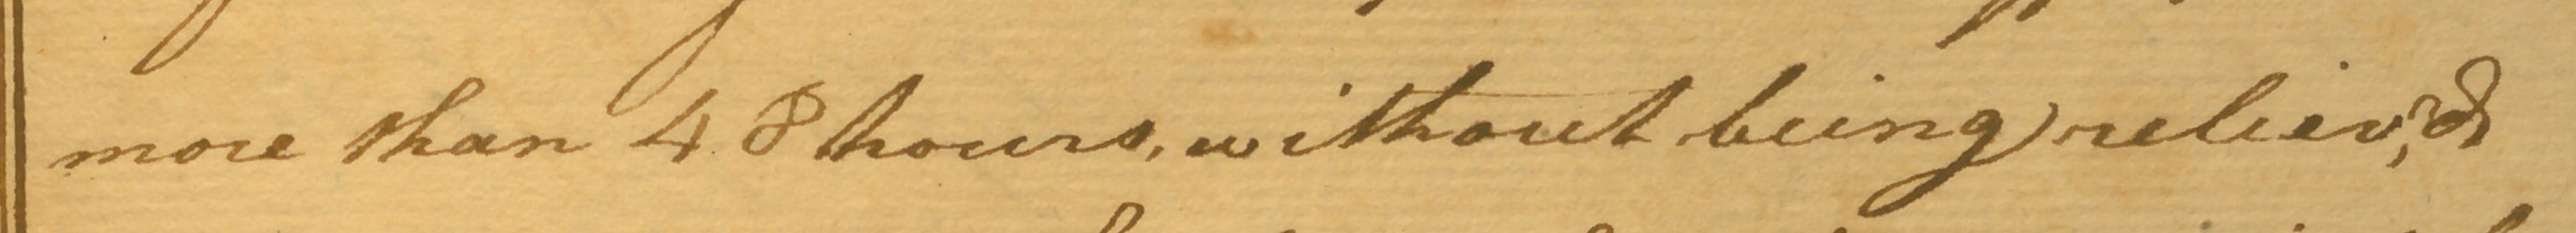more than 48 hours without being reliev'd
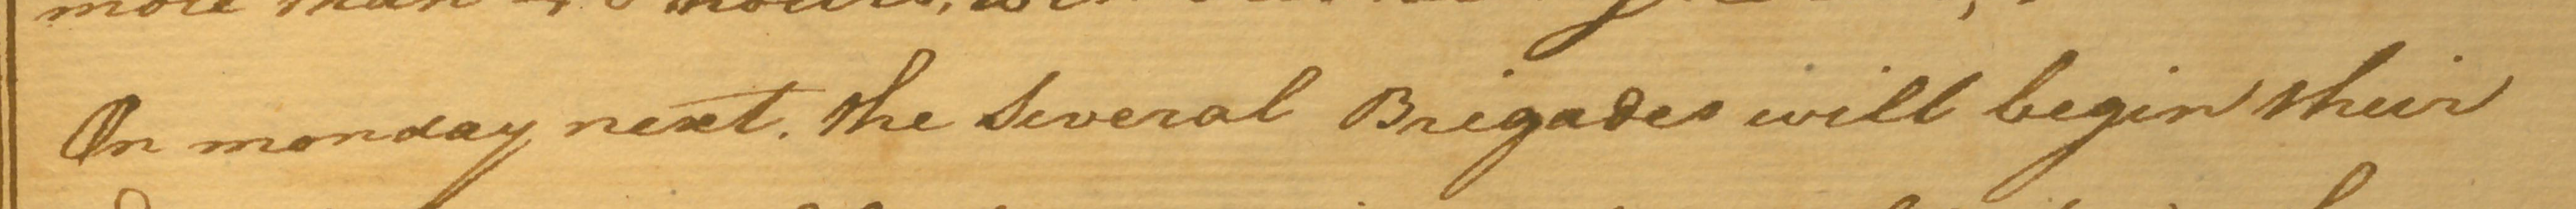On monday next. the Several Brigades will begin their
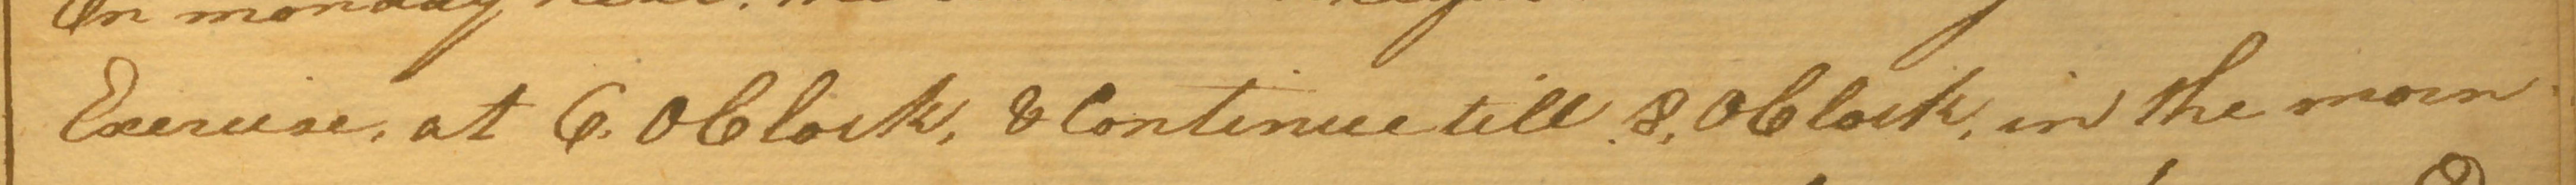Exercise at 6. OClock, & Continue till 8. OClock in the morn
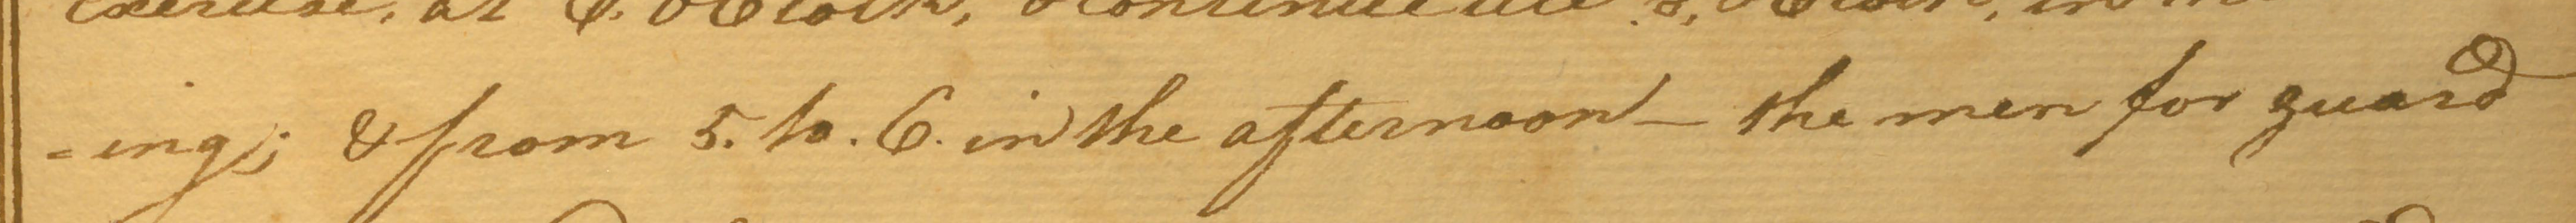-ing; & from 5. to 6. in the afternoon- the men for guard
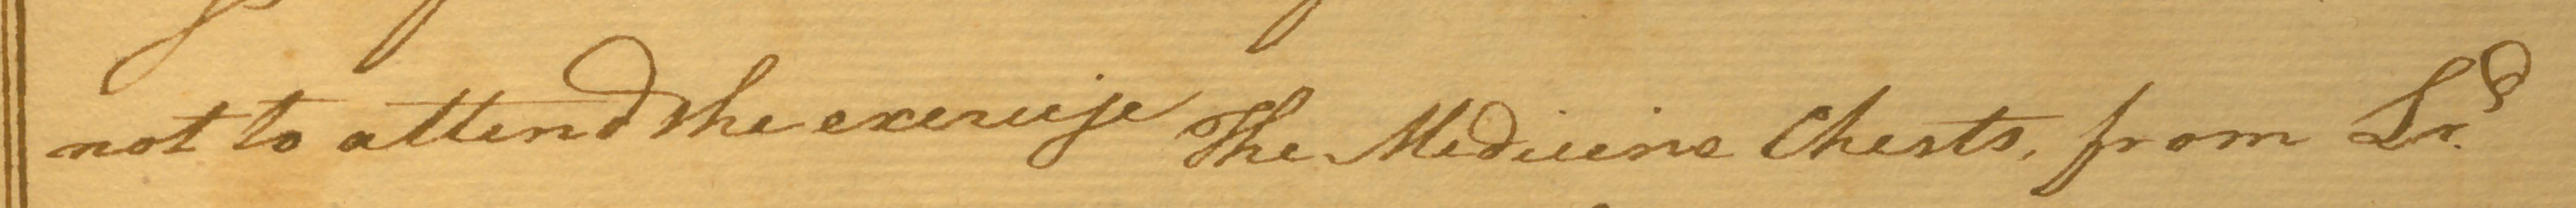not to attend the exercise The Medicine Chests, from Lr^d.
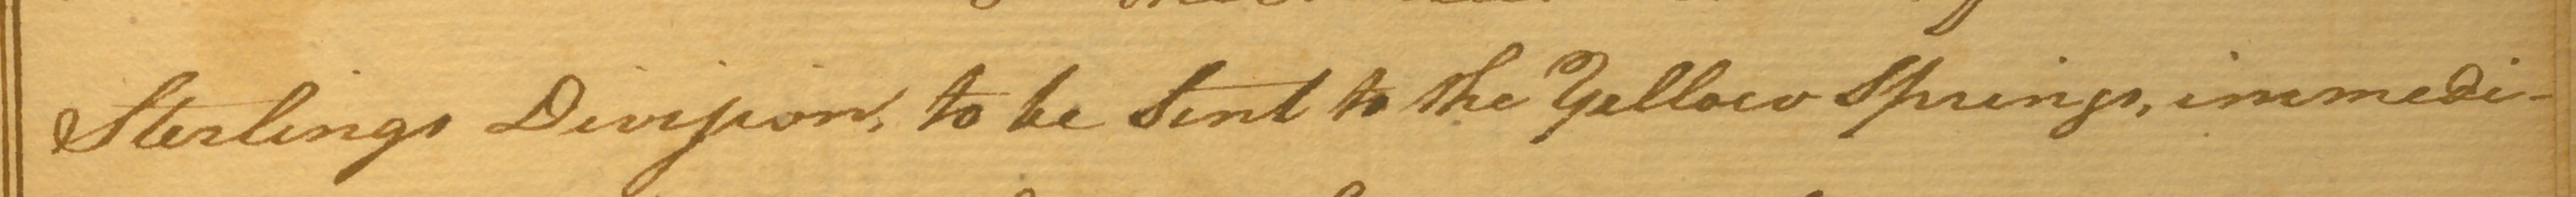Sterlings Division, to be Sent to the Yellow Springs, immedi-
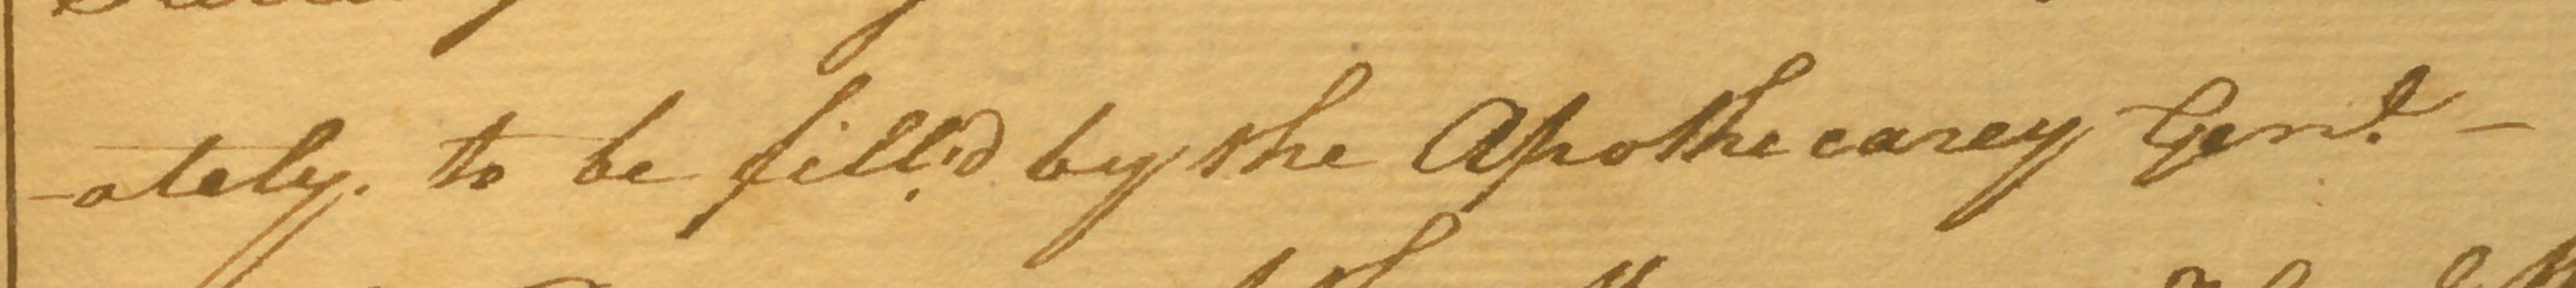-ately to be fill'd by the Apothecarey Gen^l.-
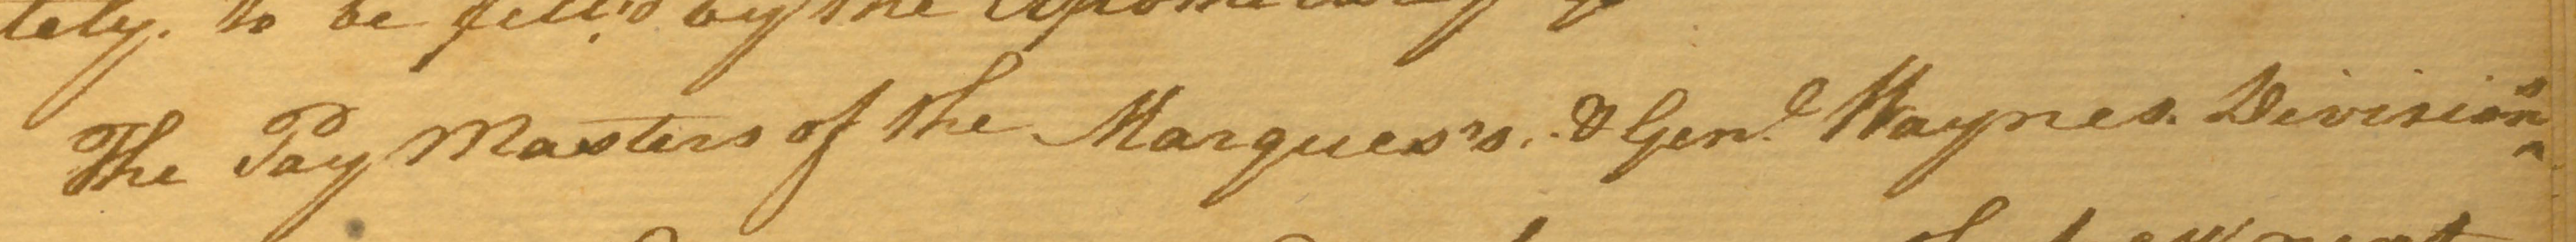The Pay Masters of the Marques's & Gen^l. Waynes Division^s
